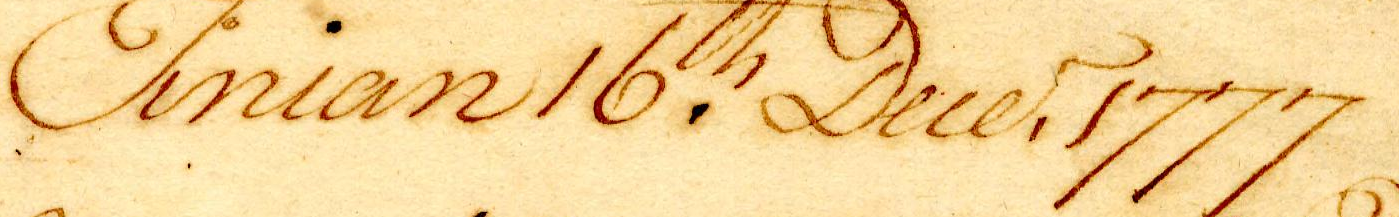Tinian 16^th. Dece^r. 1777
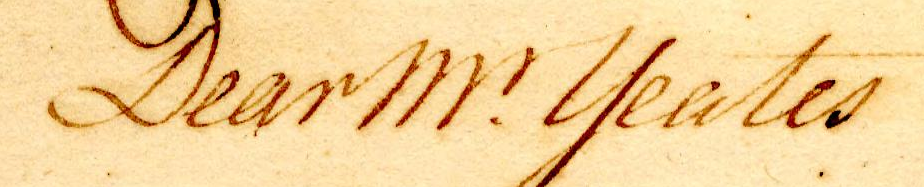Dear M^r. Yeates
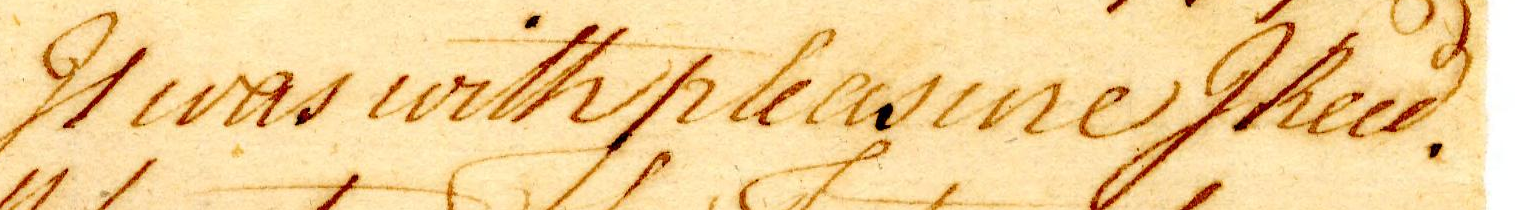It was with pleasure I Recd.
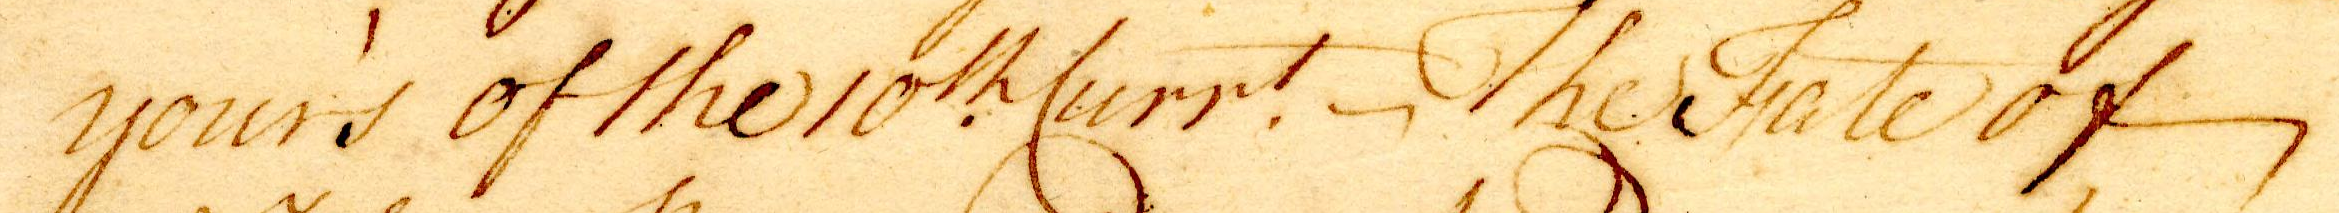yours of the 10^th. Curr^t.- The Fate of
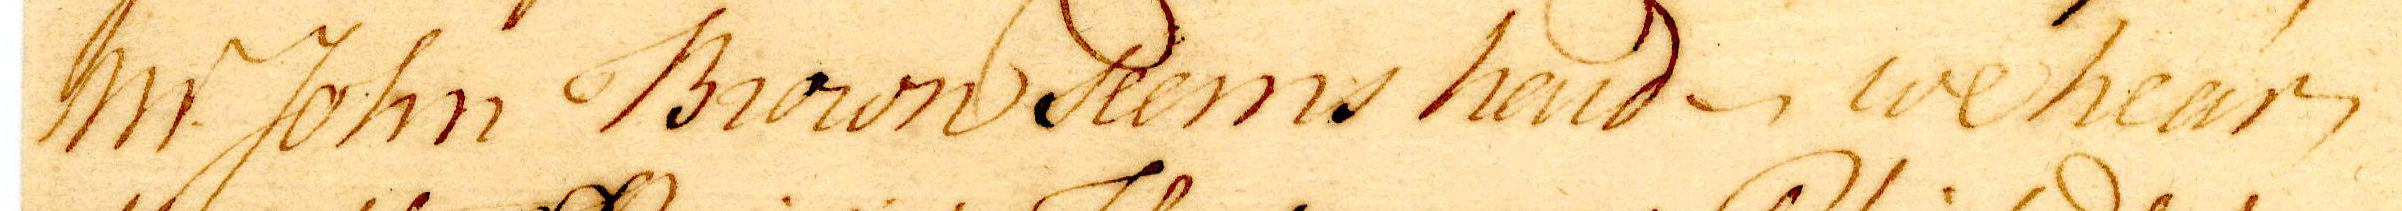M^r. John Brown seems hard- we hear
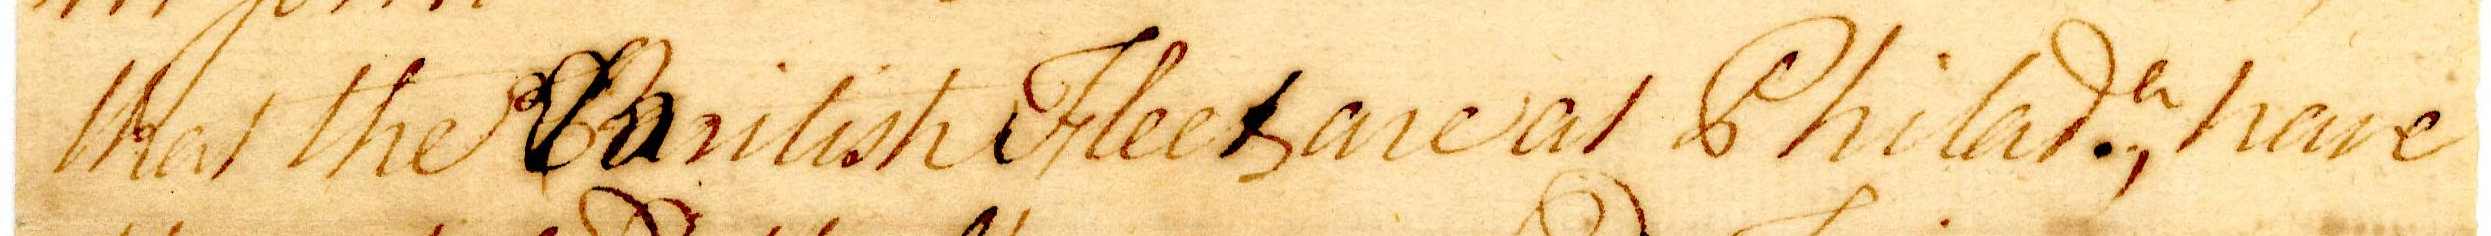that the British Fleet are at Philad^a., have
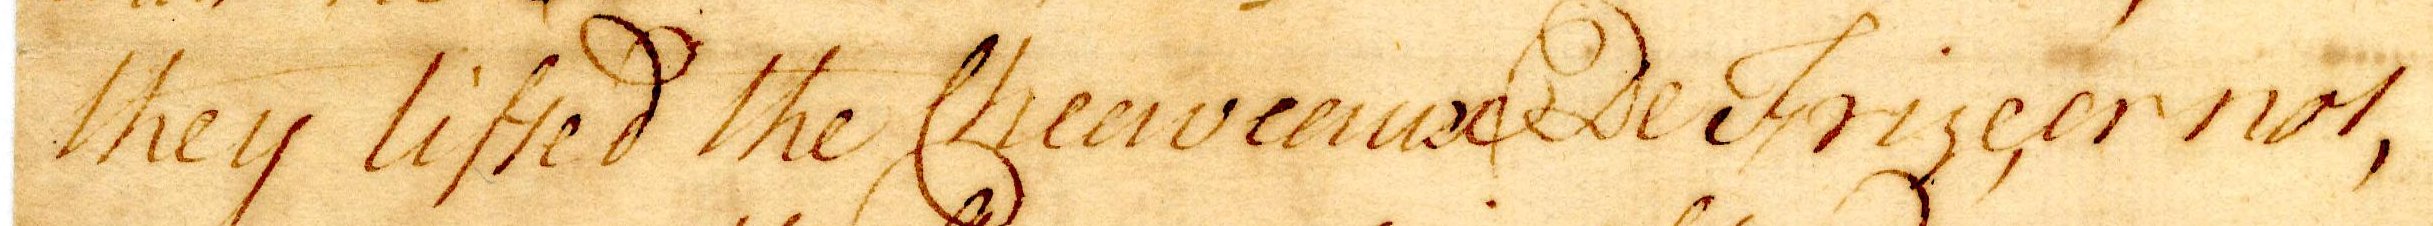they lifted the Cheaveauxe De Frize, or not,
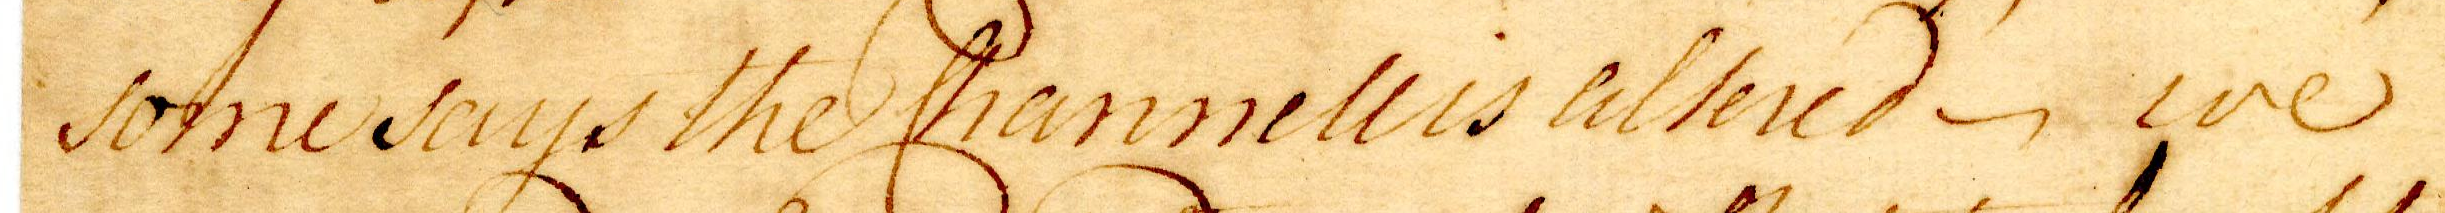some says the Channell is altered- we
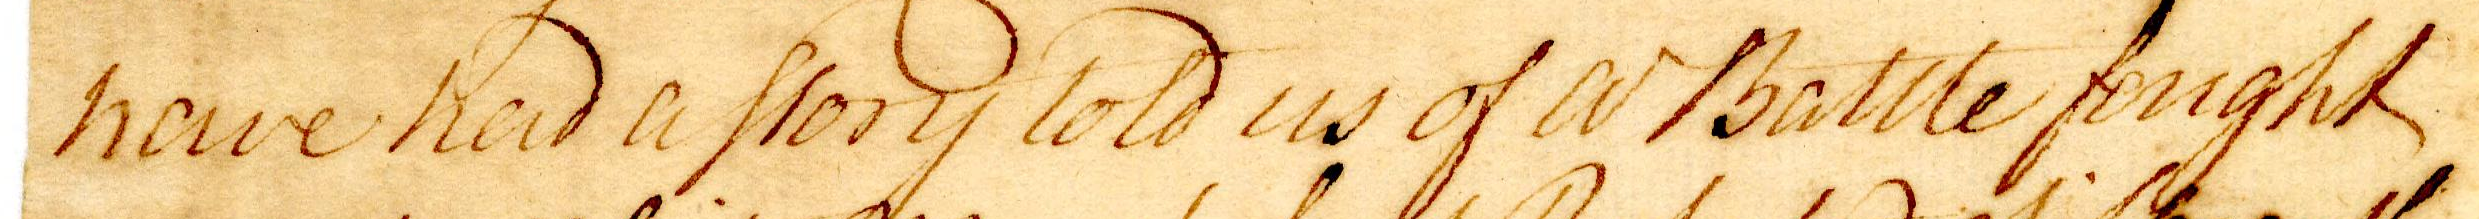have had a story told us of a Battle fought
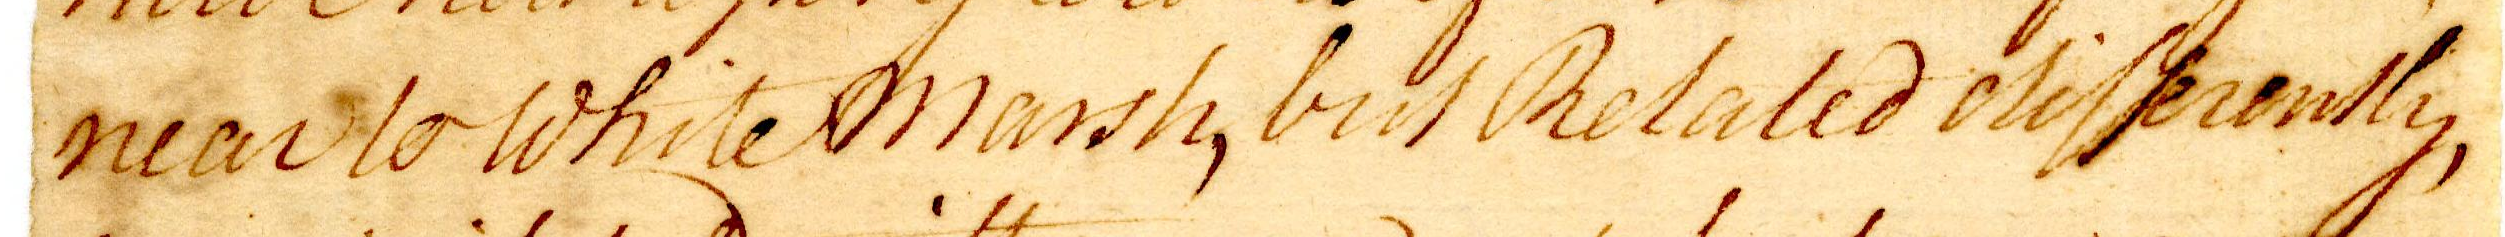near to White Marsh, but Related differently,
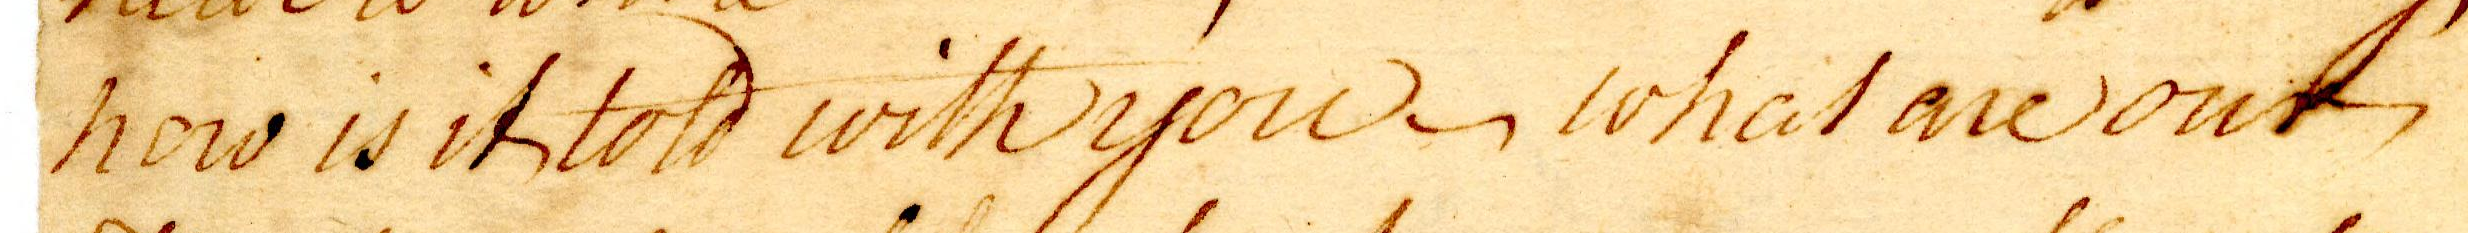how is it told with you- what are our
